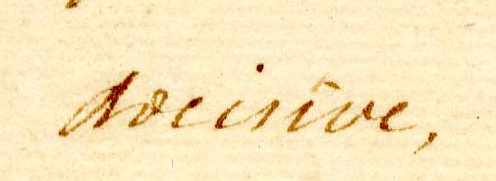decisive,
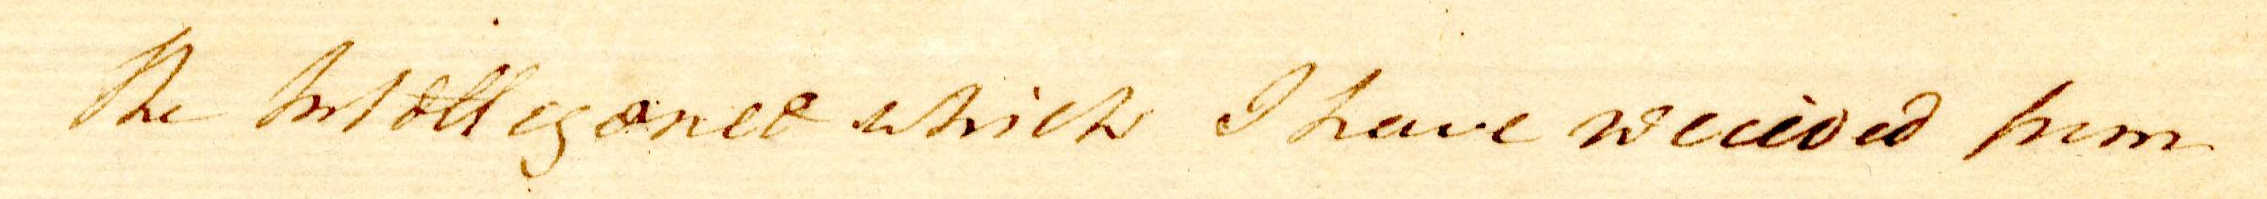the Intelligence which I have received from
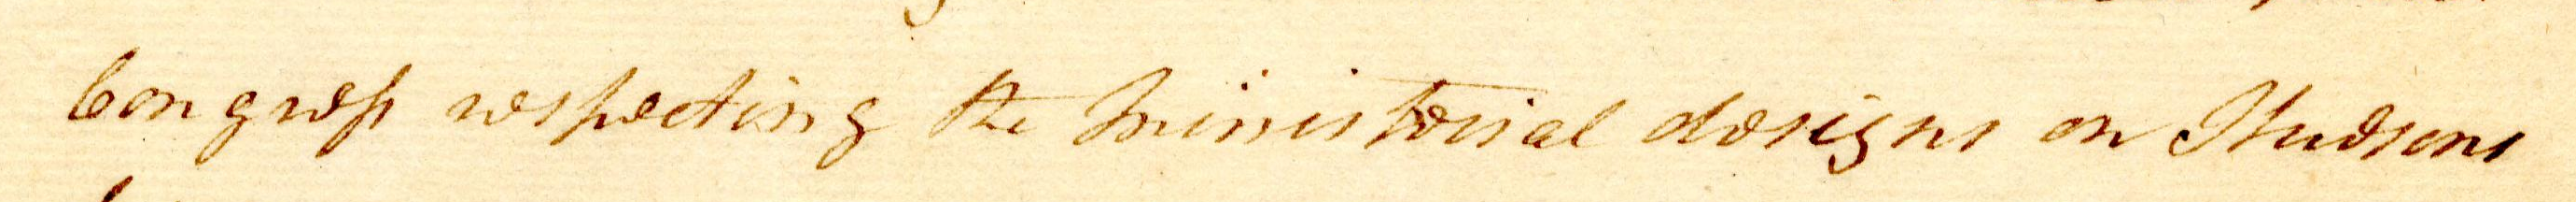Congress respecting the ministerial designs on Hudsons
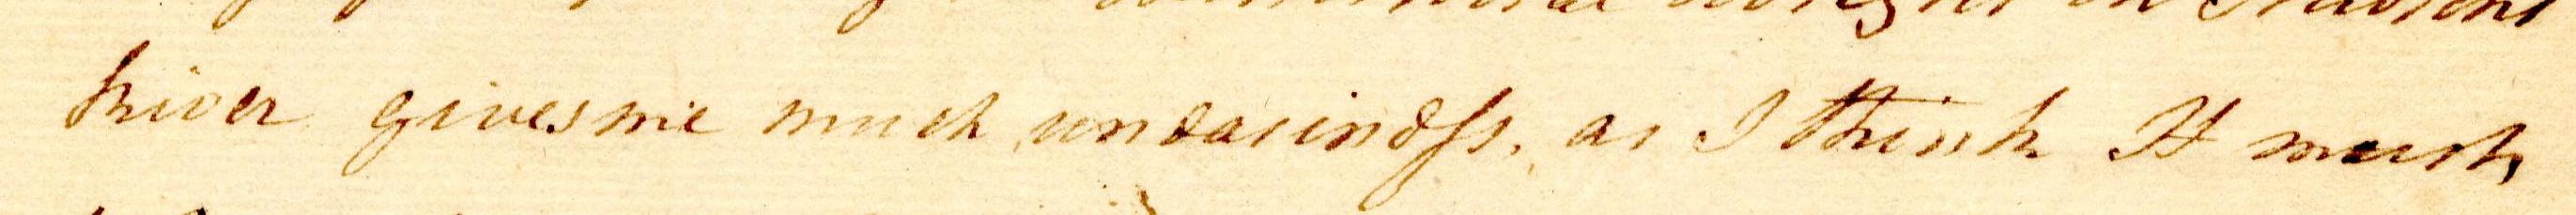River gives me much uneasiness, as I think I must
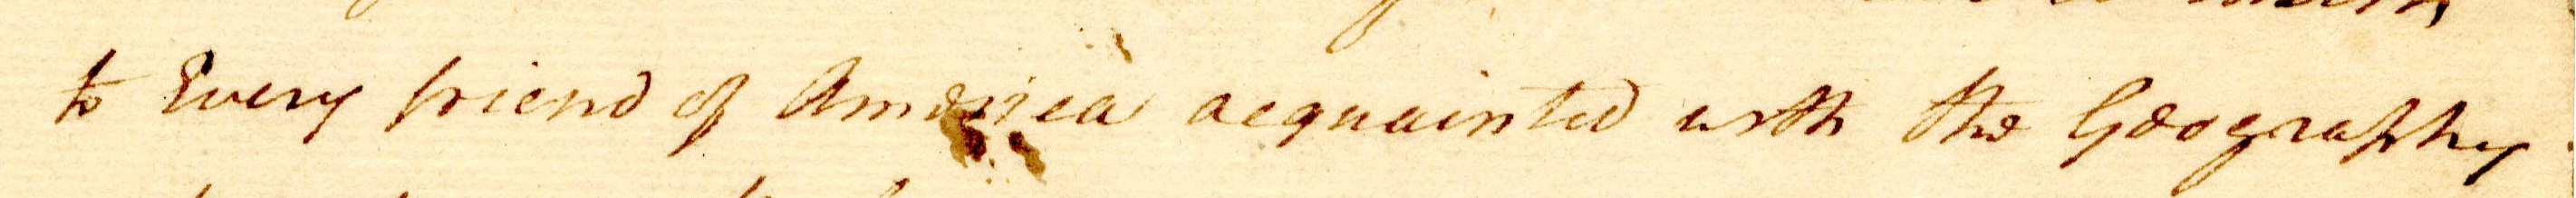to Every friend of America acquainted with the Geography
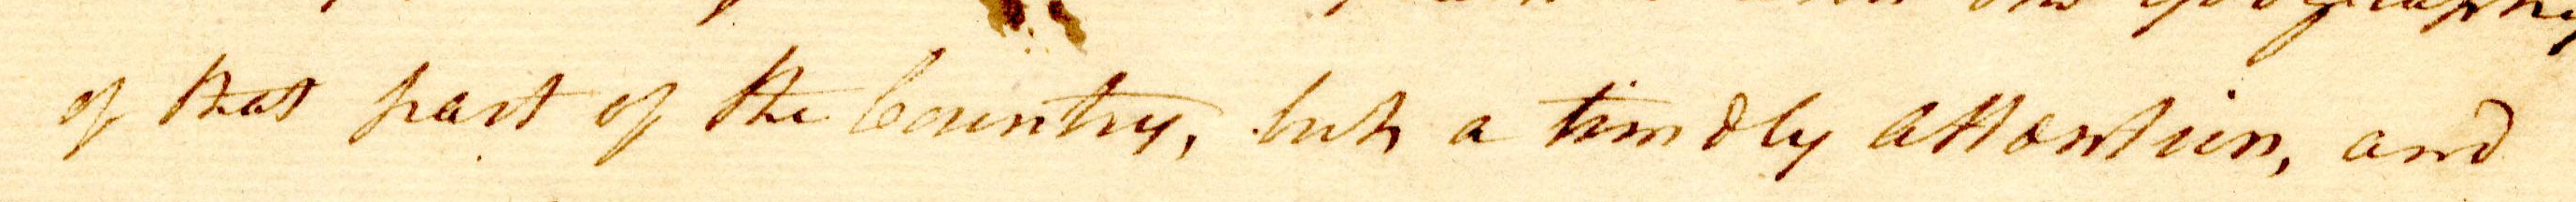of that part of the Country, but a timely attention, and
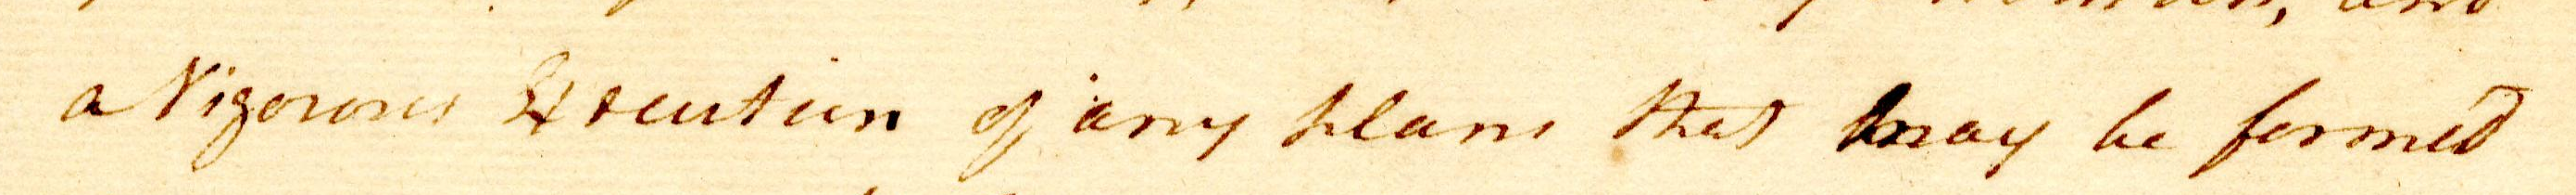a vigorous & return of any plans that may be formed
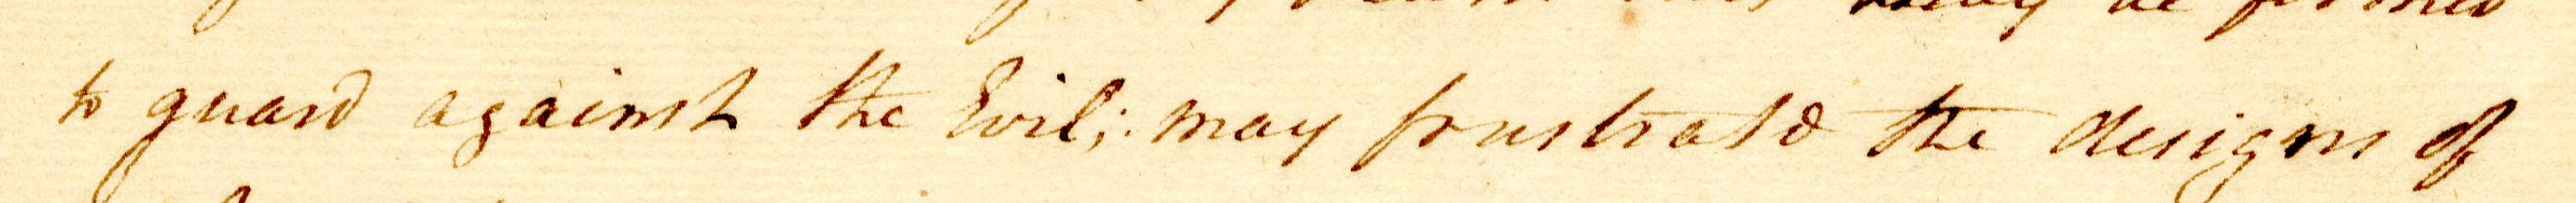to guard against the Evil; may frustrated the designs of
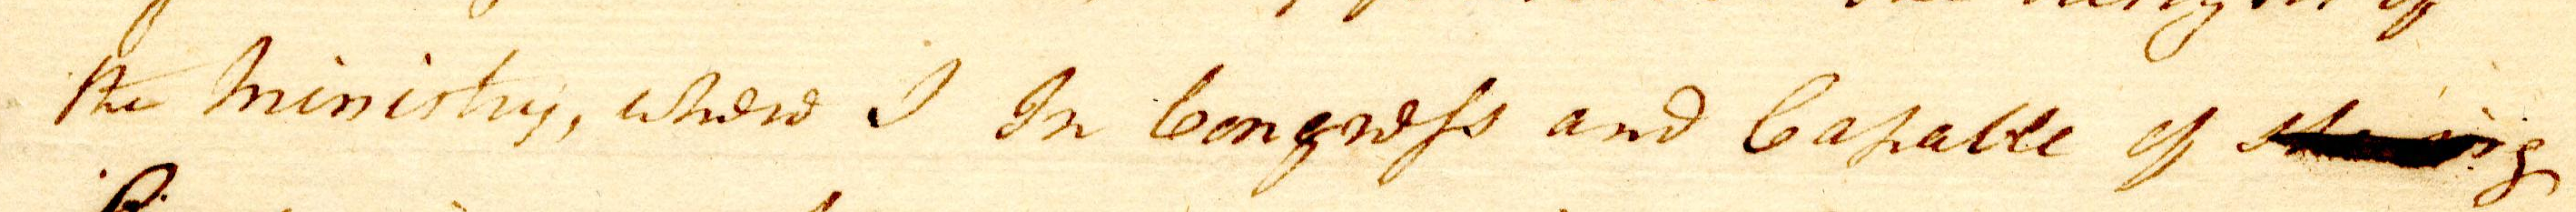the ministry, when I In Congress and Capable of [____]g
